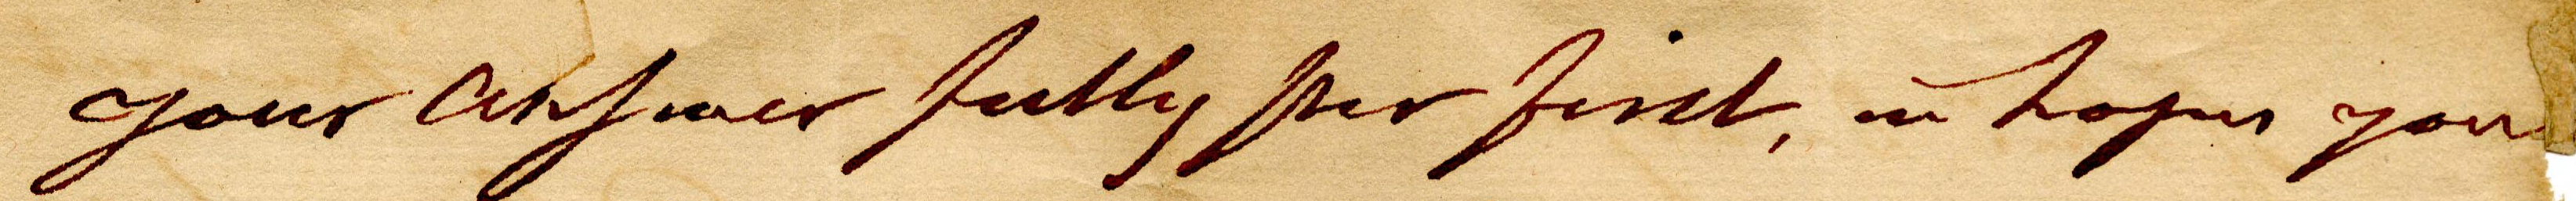Your Answer fully per first, in hopes you
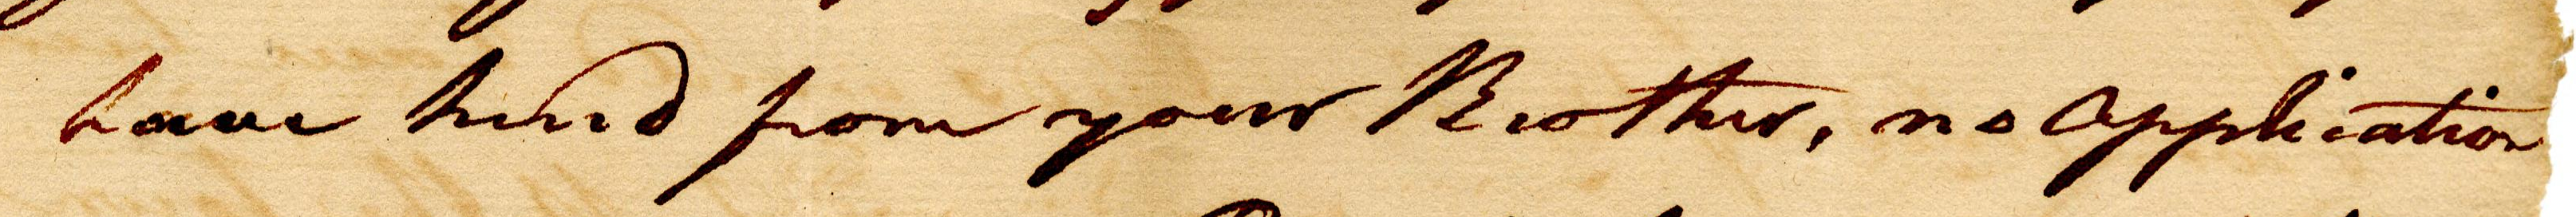have heard from your Brother, no application
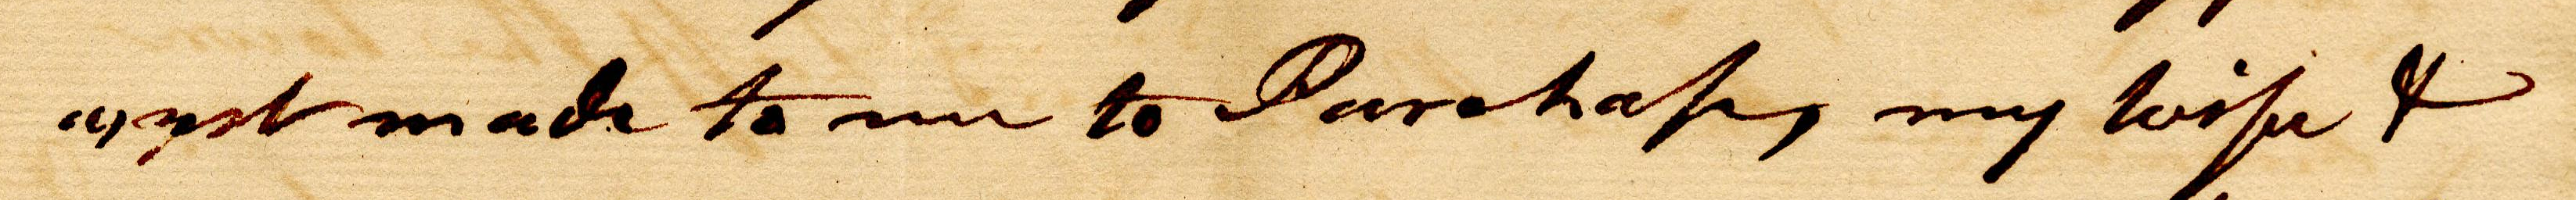you made to me to Purchase, my wife &
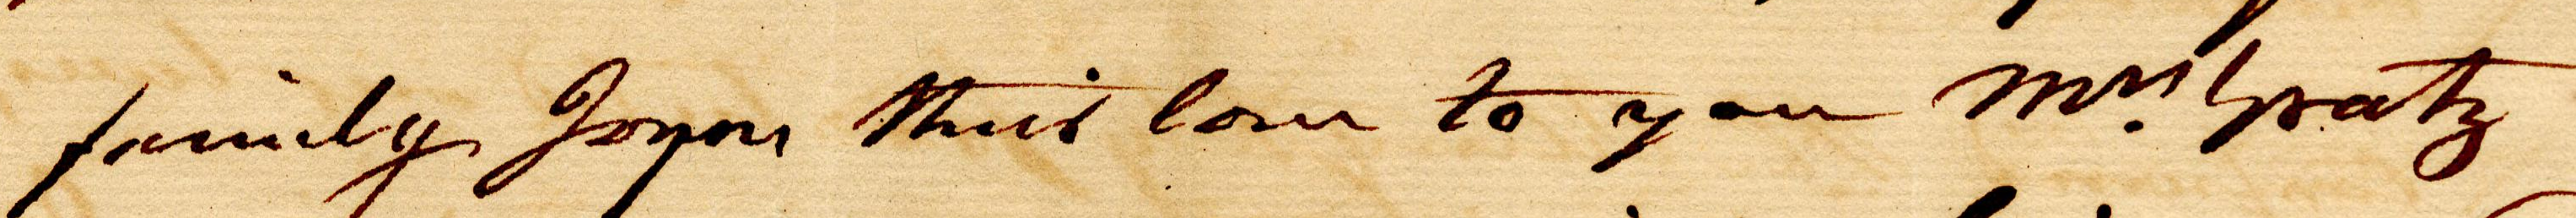family Joyns their love to you M^rs. Gratz
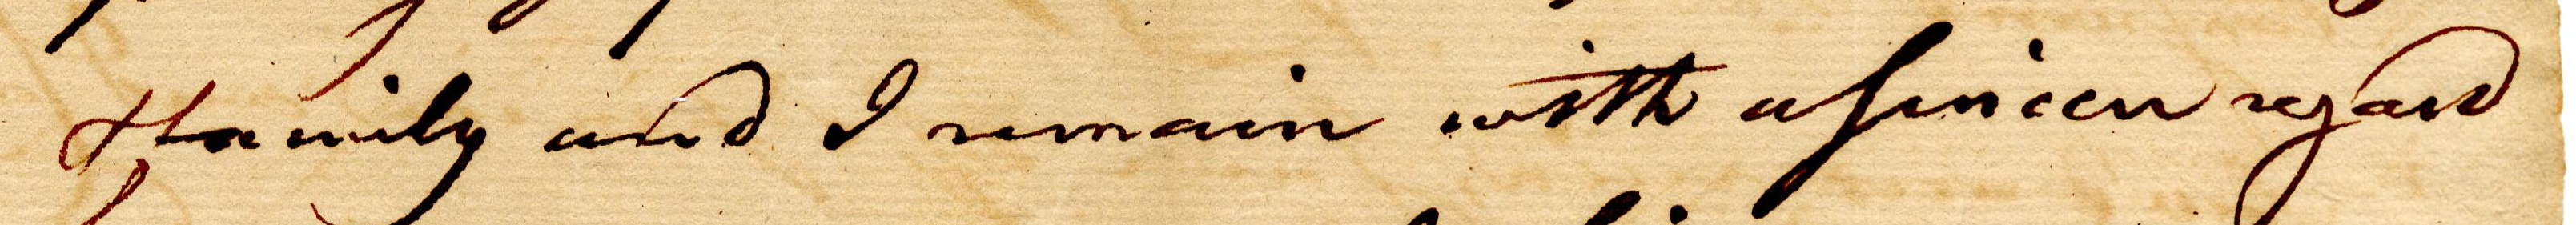& family and I remain with a sincere regard
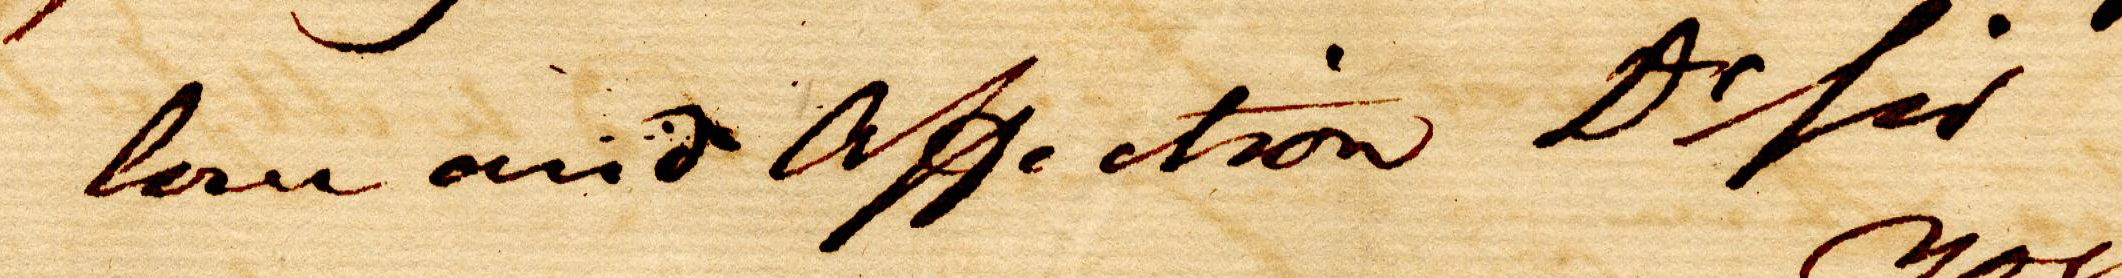love and Affection D^r sir
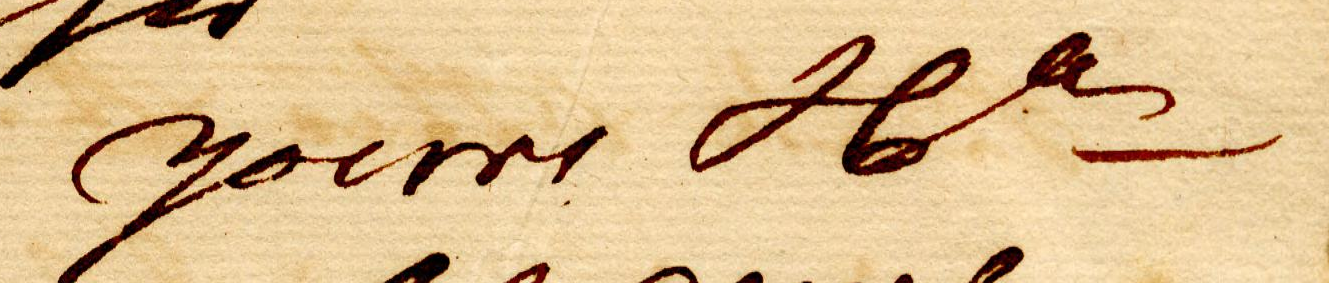yours & c^a-
